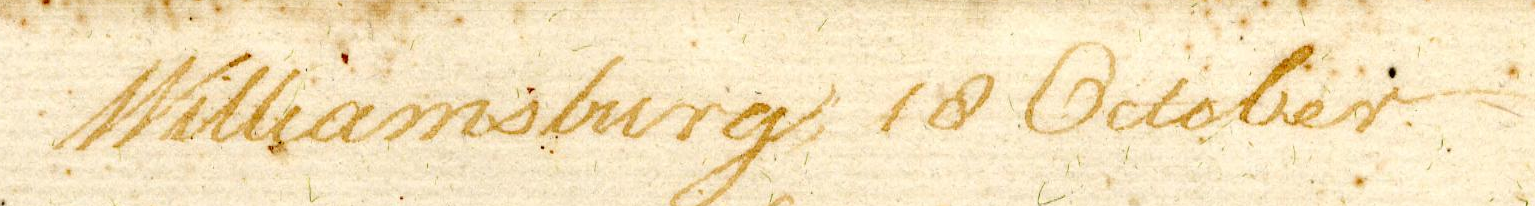Williamsburg 18 October
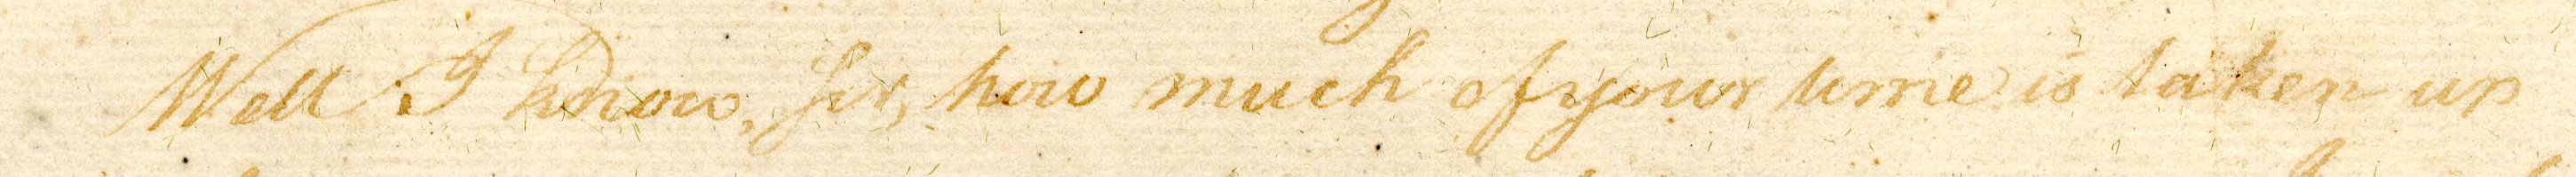Well I know, sir, how much of your time is taken up
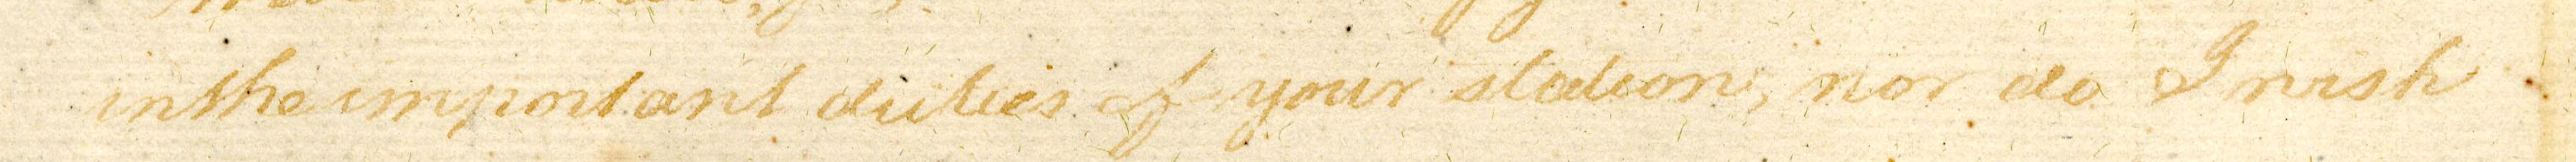in the important duties of your station, nor do I wish.
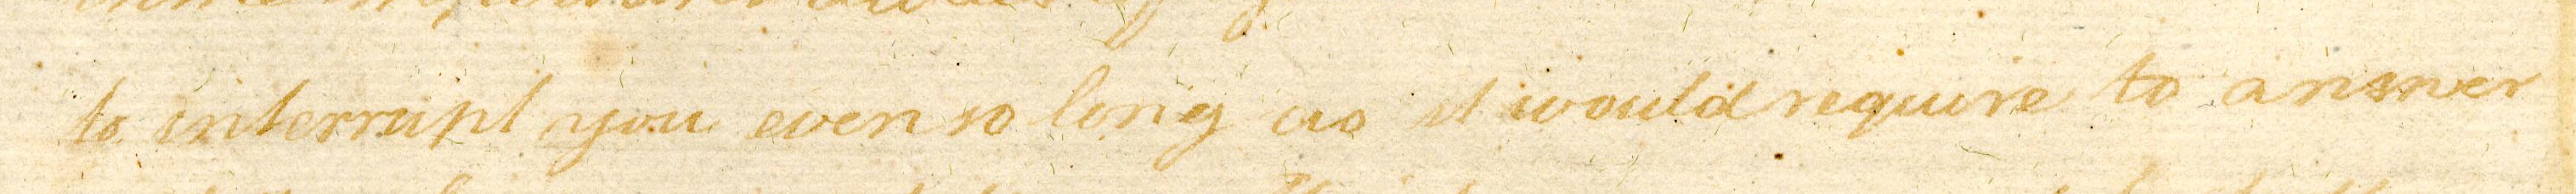to interrupt you even so long as it would require to answer
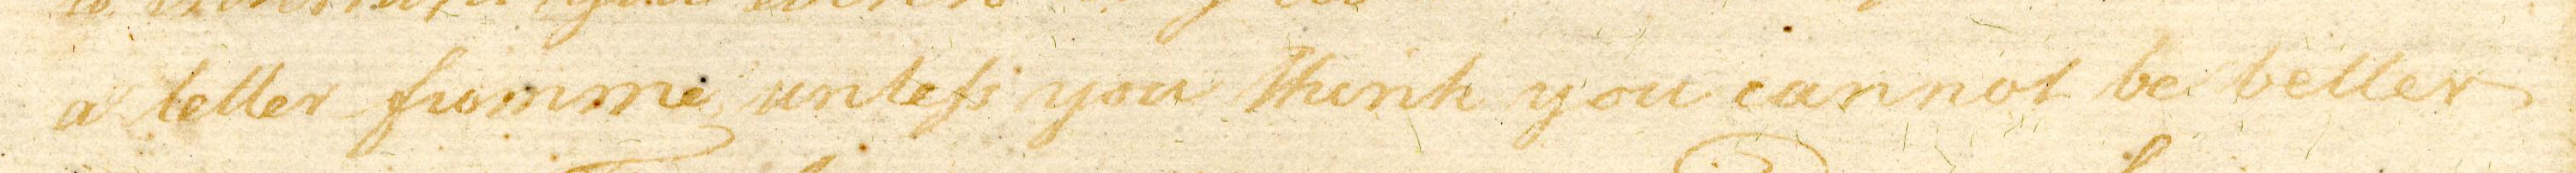a letter from me unless you think you cannot be better
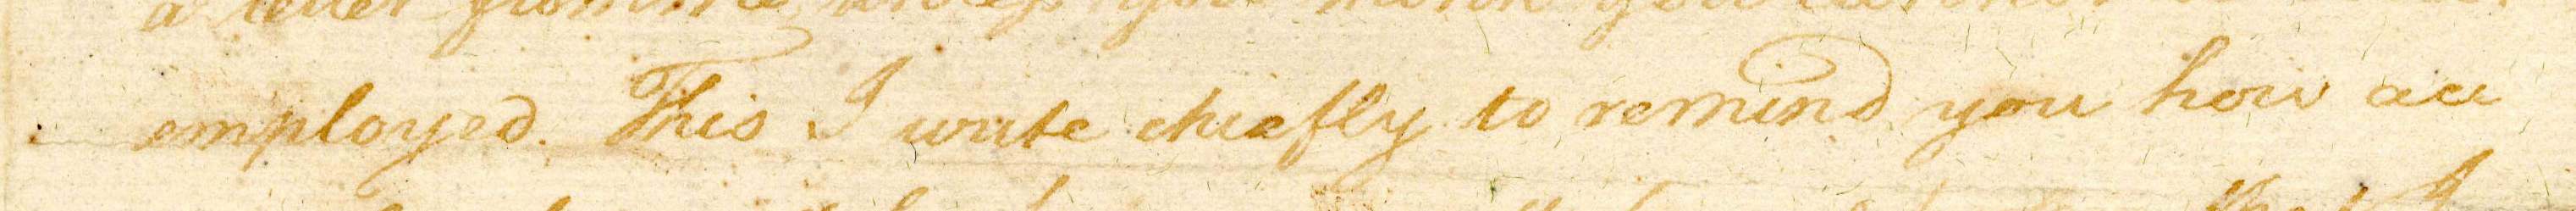employed. This I write chiefly to remind you how all
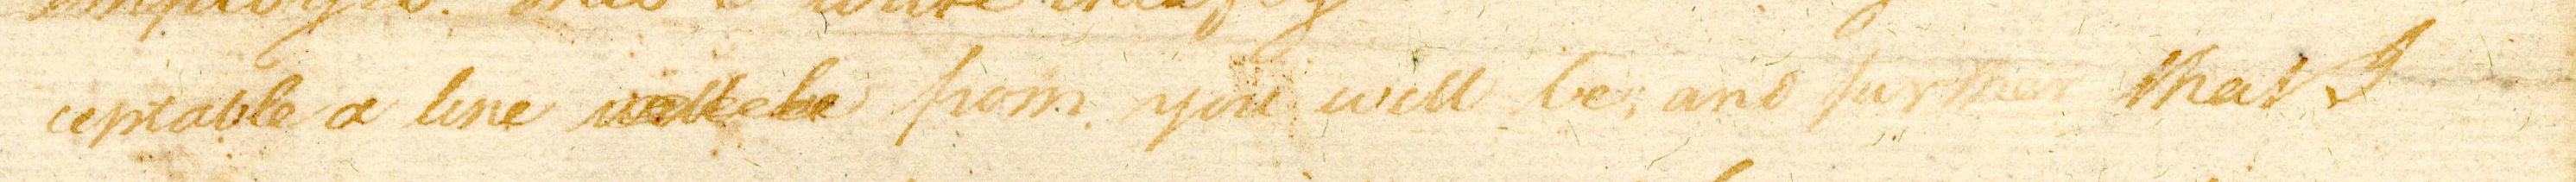respectable a line will be from you will be, and further that I
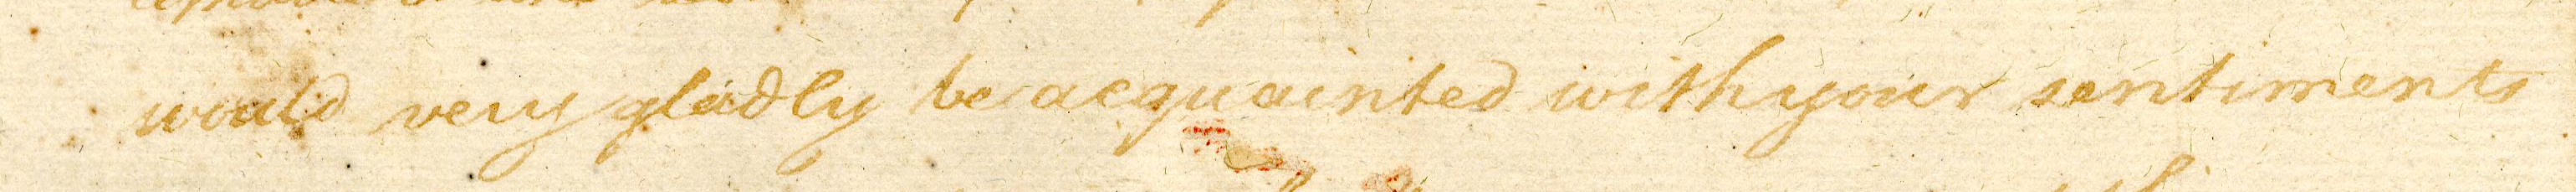would very gladly be acquainted with your sentiments
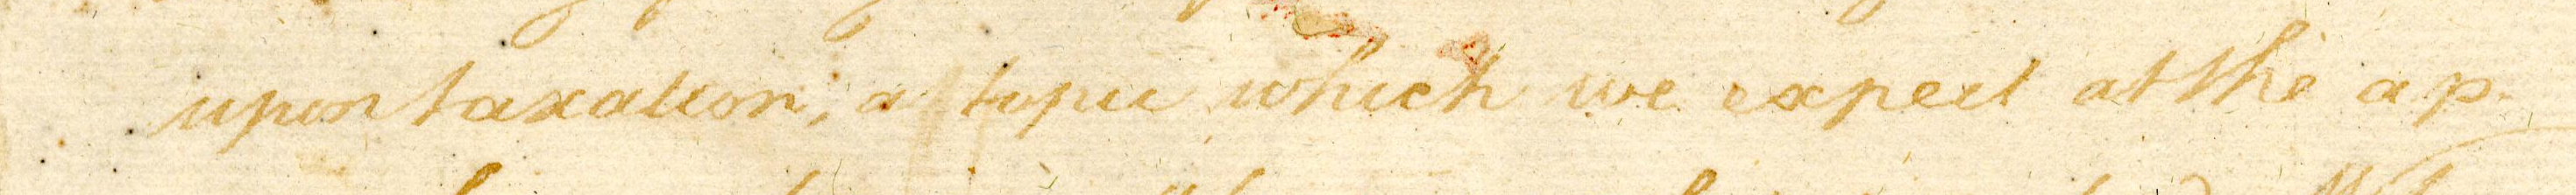upon taxation; a topic which we expect at the ap-
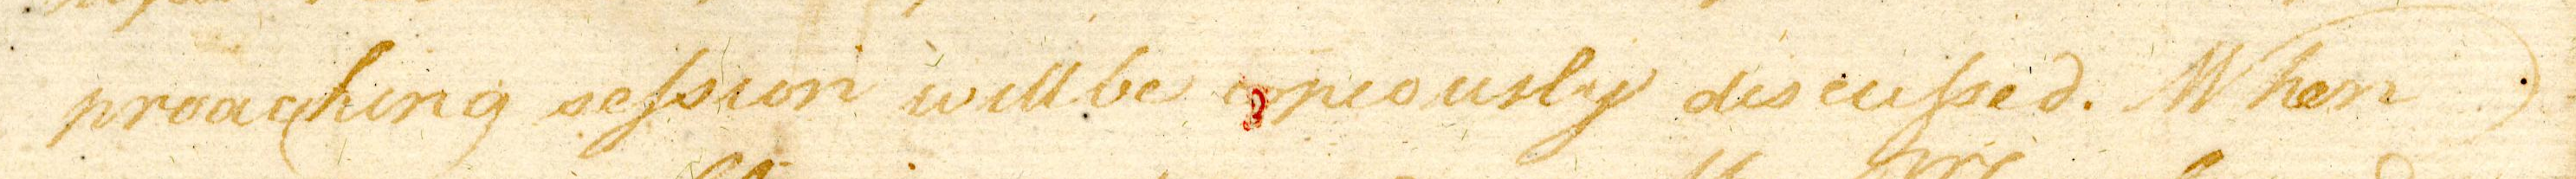-proaching session will be copiously discussed. When
